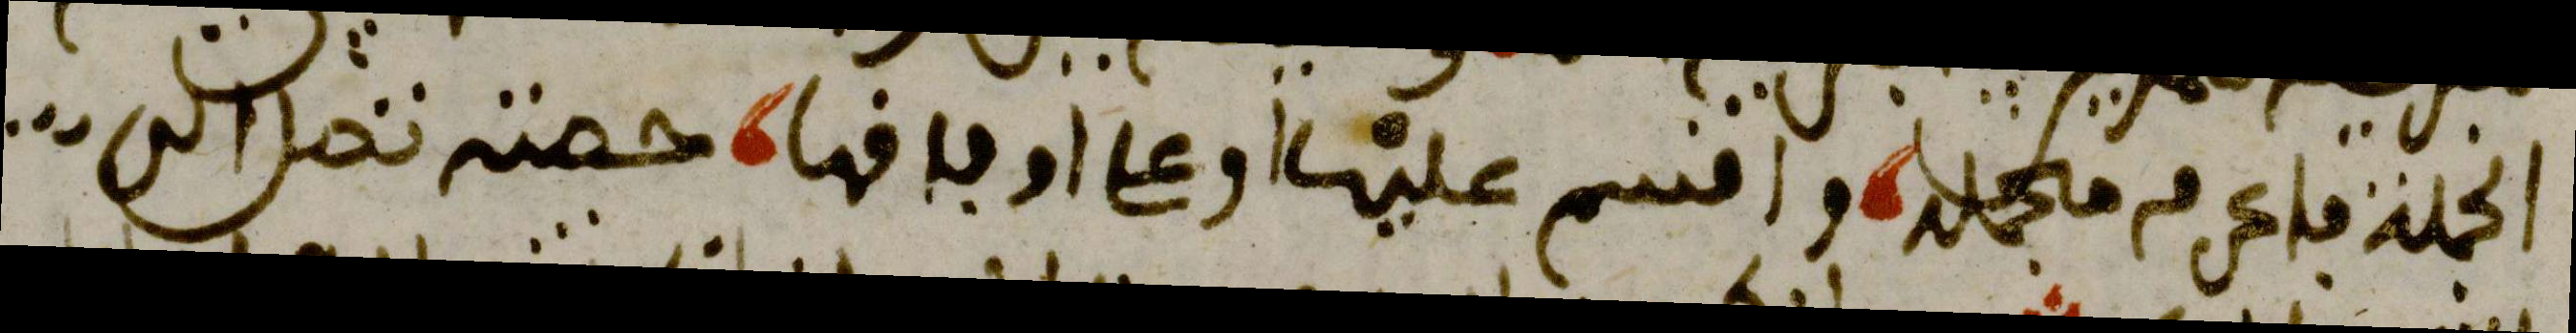الجملة فاعرف مجمله واقسم عليْها او على اوفاقها حصته تصل الى
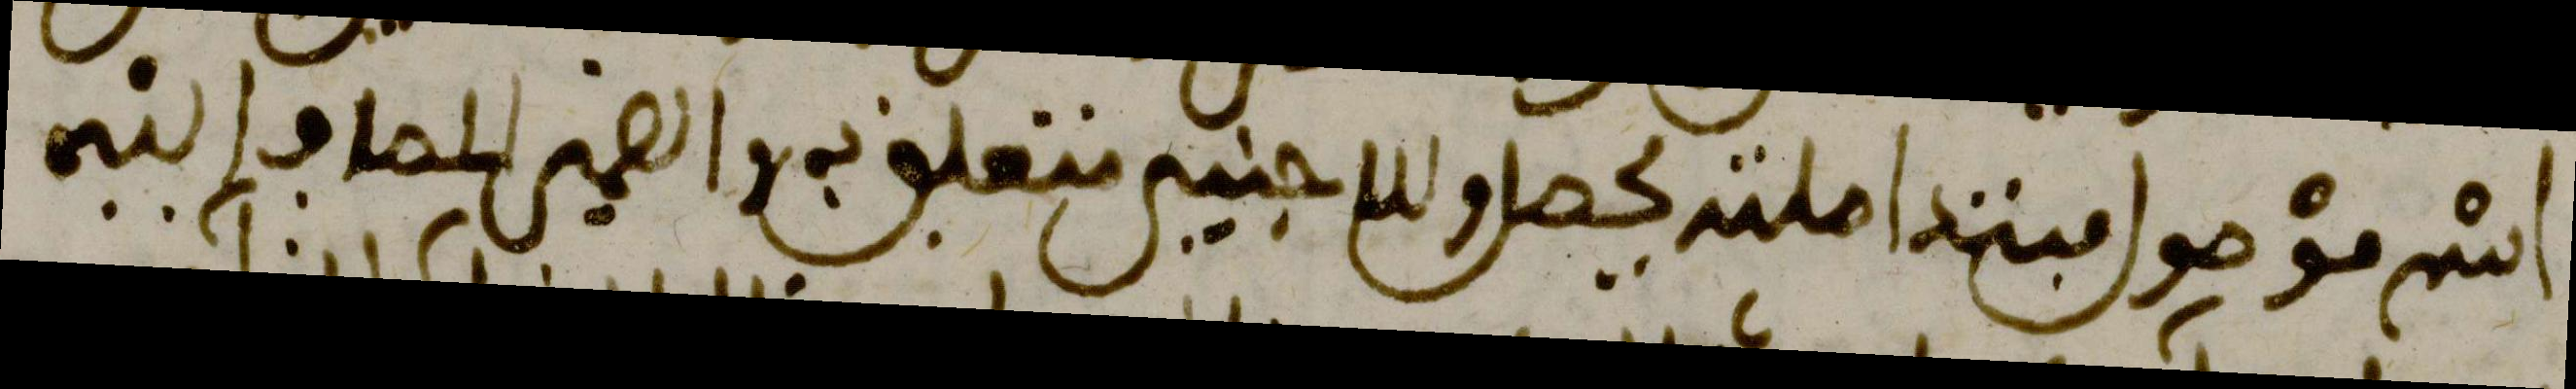اسْم موْصول مبتدا صلته يحصل وللاجنبي متعلق به والضمير المضاف اليْه
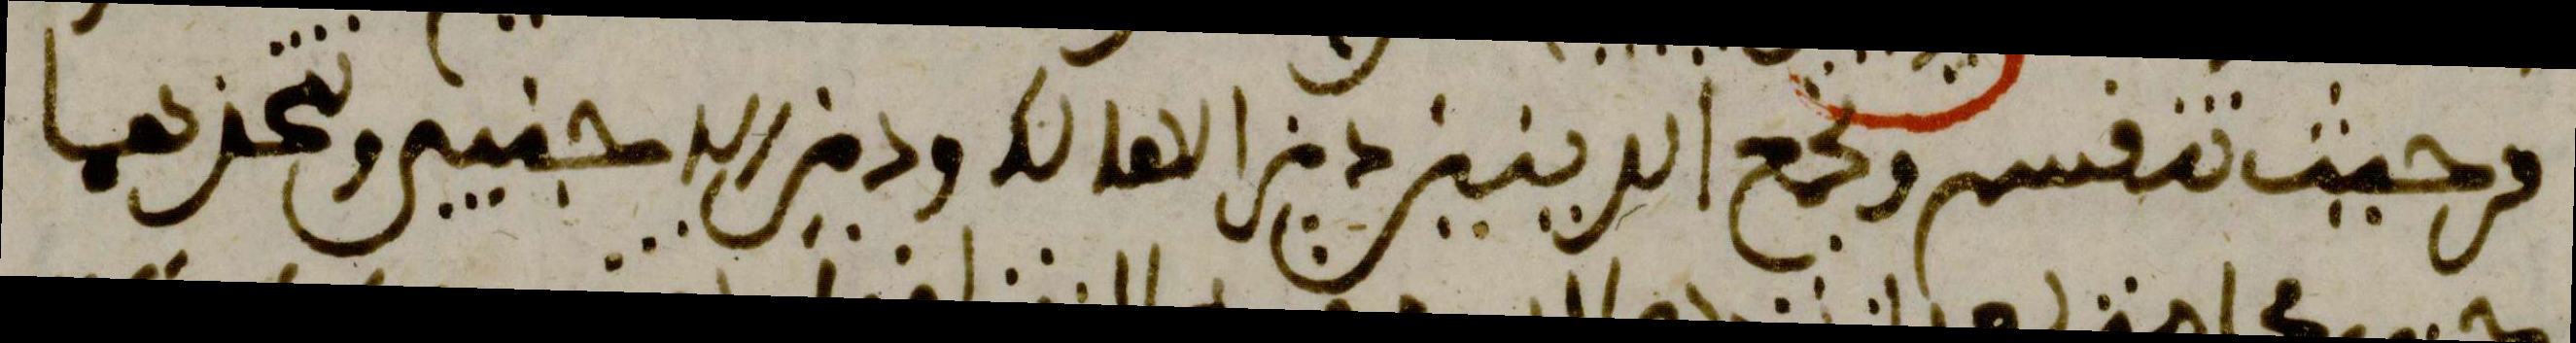من حيث تنقسم وتجمع الدينين دين الهالك ودين الاجنبي وتتخذهما
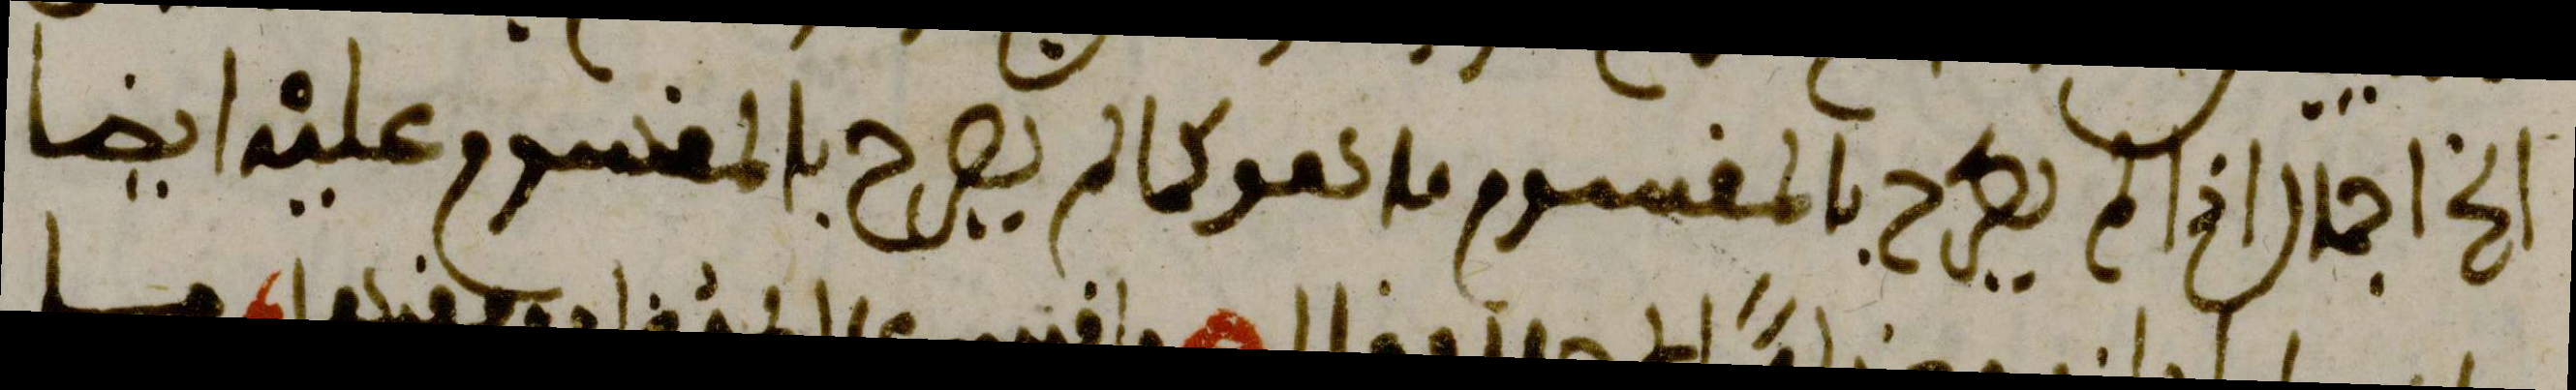الخ اجمال اذ لم يطرح بالمقسوم ما هو كما لم يصرح بالمقسوم عليْه ايضا
